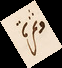وثمرة
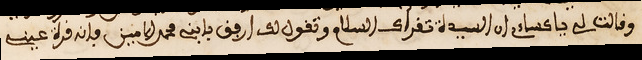وقالت لى يا كساءى ان السيدة تقراك السلام تقول لك ارفق بابنى محمد الامين فانه قرة عينى
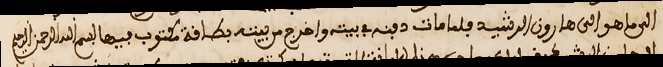الى ما هو الى هارون الرشيد فلما مات دفنه في بيته واخرج من بيته بطاقة مكتوب فيها البسم الله الرحمن الرحيم
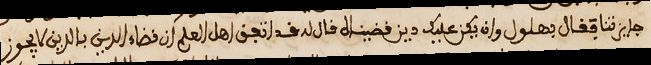جايزتنا فقال بهلول وان يكن عليك دين قضيناه قال له قد اتفق اهل العلم ان قضاء الدين بالدين لا يجوز
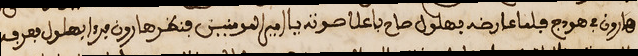هارون في هودج فلما عارضه بهلول صاح باعلا صوته يا امير المومنين فنظر هارون فرءا بهلول فعرفه
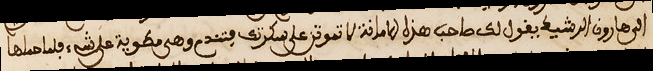الى هارون الرشيد يقول لك صاحب هذه الامانة لا تموتن على سكرتك فتندم وهى مطوية على شئ فلما حملها
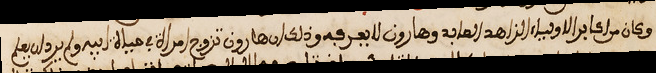وكان من اكابر الاولياء الزاهد العابد وهارون لا يعرفه وذلك ان هارون تزوج امراة في حياة ابيه ولم يرد ان يعلم
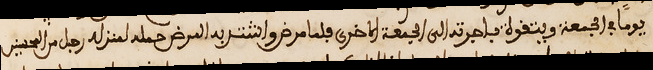يوما في الجمعة ويتقوة باجرته الى الجمعة الاخرى فلما مرض واشتربه المرض حمله لمنزله رجل من المحسنين
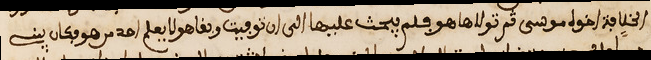الخلافة اخوه موسى ثو تولاها هو فلم يبحث عليها الى ان توفيت وبقا هو لا يعلم احد من هو فكان يبنى
